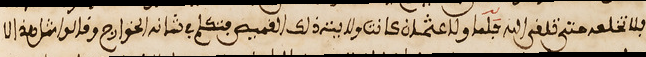فلا تخلعه حتى تلقى الله فلما ولا عثمان كانت ولا يته ذلك القميص فتكلم في شانه الخوارج وقالوا مثل هذا لا
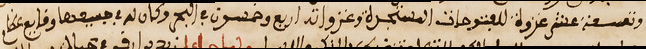وتسعة عشر غزوة للفتوحات المستجدة وغزواته اربع وخمسون في البحر وكان له في جميعها وقايع عظام
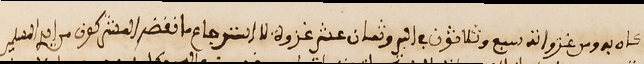كان به غزواته سبع وثلاثون في البر وثمان عشر غزوة استرجاع ما نقضه المشركون من ايدى المسلمين
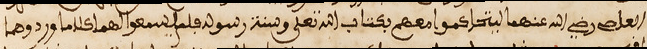العاص رضي الله عنهما ليتحاكموا معهم بكتاب الله تعلى وسنة رسوله فلم يسمعوا الهما كلاما وردوهما
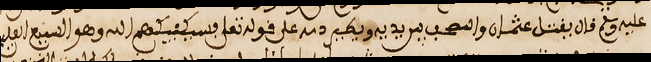عليه وسلم قال يقتل عثمان و المصحف بين يديه ويطير دمه على قوله تعلى فسيكفيكهم الله وهو السميع العليم
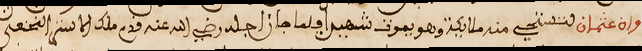وان عثمان لتستحي منه ملايكة وهو يموت شهيدا فلما جان اجله رضي الله عنه قدم ملك الاستر النخعى
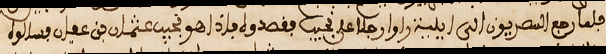فلما رجع المصريون الى ايلية راوا رجلا على نجيب فقصدوه فاذا هو نجيب عثمان بن عفان فسالوه
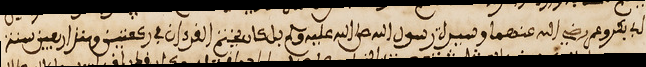ابى دكر وعمر رضي الله عنهما وسيرة رسول الله صلى الله عليه وسلم بل كان يختم القرءان في ركعتين ومنذ اربعين سبة
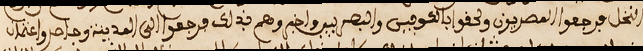النخل فرجعوا المصريون ولحقوا بالكوفين والبصريين واخبروهم بذلك فرجعوا الى المدينة وحاصروا عثمان
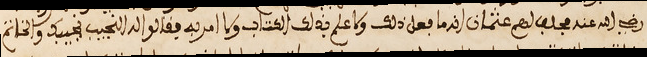رضي الله عنه فحلف لهم عثمان انه ما فعل ذلك ولاعلم بذلك الكتاب ولا امر به فقالوا له النجيب نجيبك والخاتم
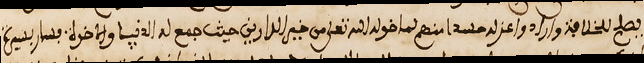يصلح للخلافة وارادوا عزله حسدا منهم لما خوله الله تعلى من خير الدارين حيث جمع له الدنيا والاخرة فسار بسيرة
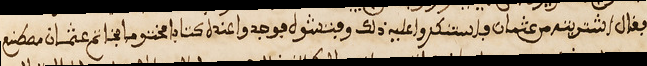فقال اشتريته من عثمان فاستنكروا عليه ذلك وفتشوه فوجدوا عنده كتابا مختوما بخاتم عثمان مصطفى
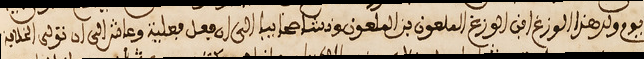يوم ولد هذا الوزغ ابن الوزغ المعلوم بن المعلوم نشا صحابيا الى ان فعل فعليه وعاش الى ان تولى الخلافة
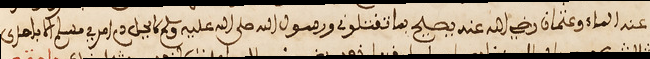عنه الماء وعثمان رضي الله يصيح بما تقتلون ورسول الله صلى الله عليه وسلم لا يحل دم امر في مسلم الا باحدى
